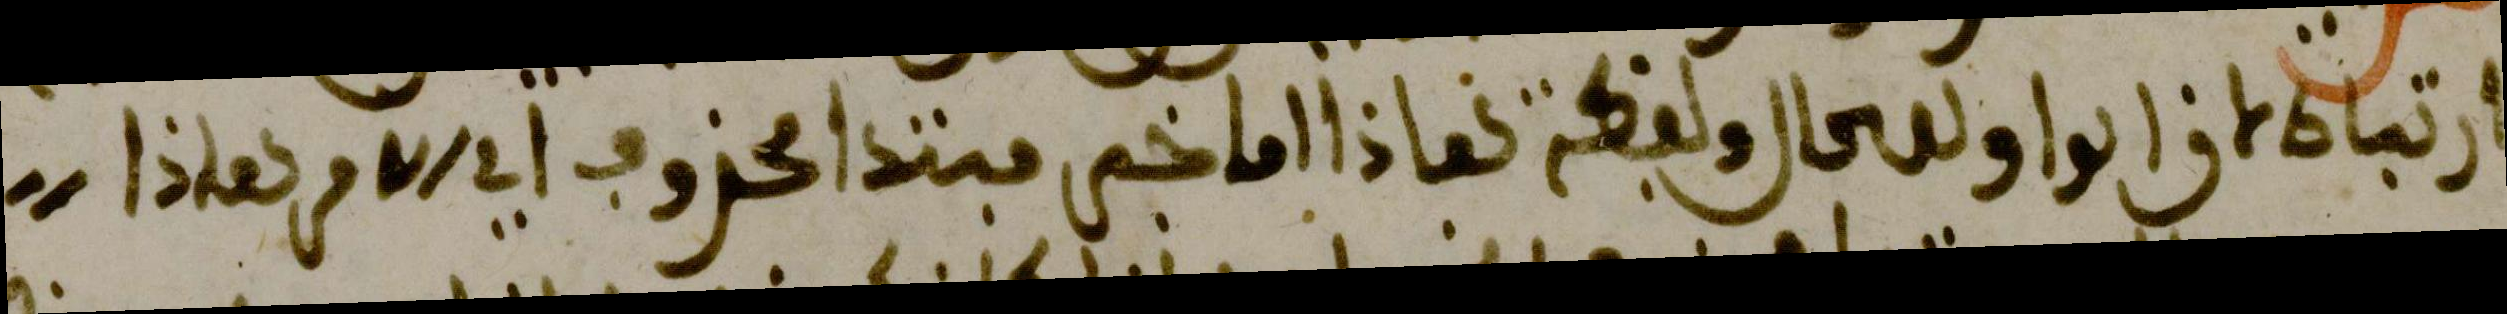ارتباط لان الواو للحل ولفظة هاذا اما خبر مبتدا محذرف اي الامر هاذا
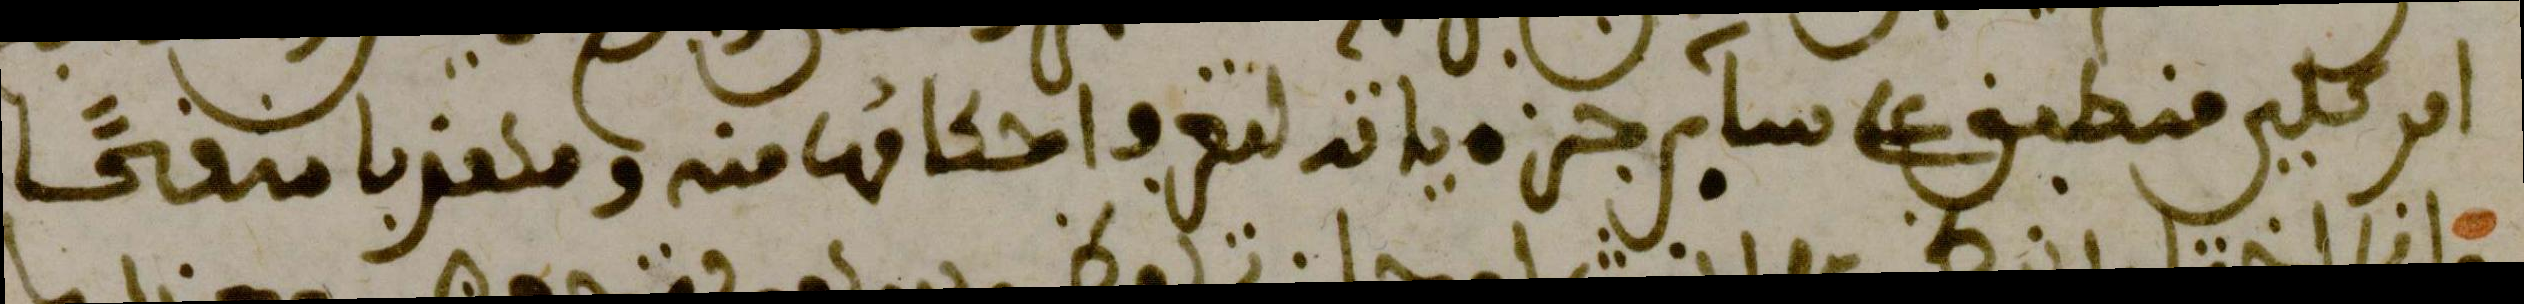امر كلي منطبق على سائر جزء ياته لتعرف احكامها منه ومهذبا منقحًا
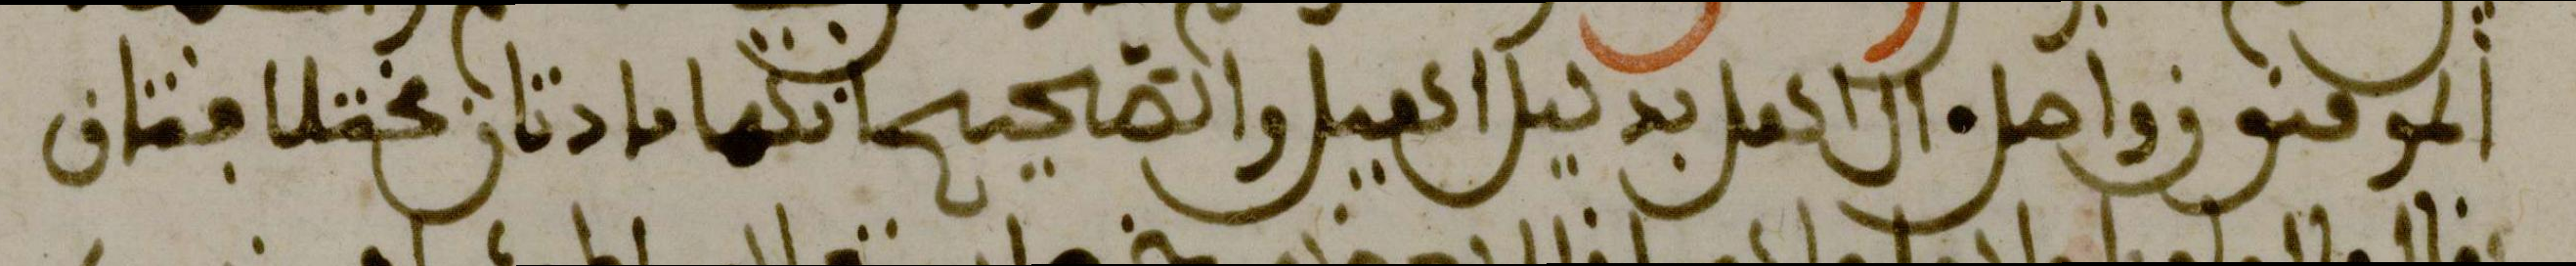المومنون واصل ءال اهل بدليل اهيل والصحيح انها ما دتان مختلا فتان
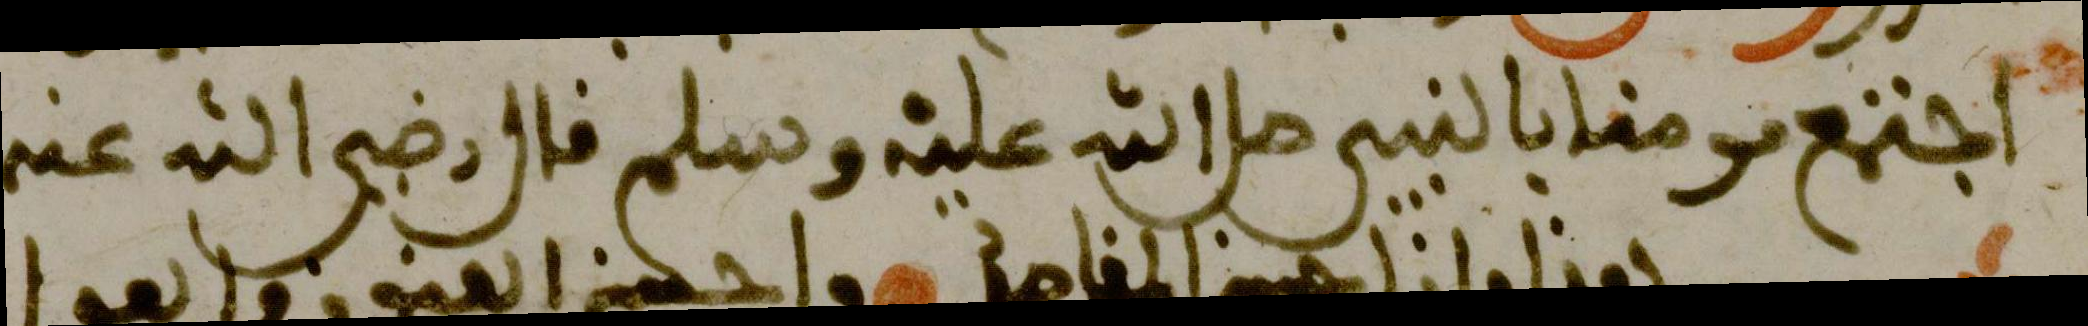اجتمع مومنا بالنبي صل الله عليه وسلم قال رضي الله عنه
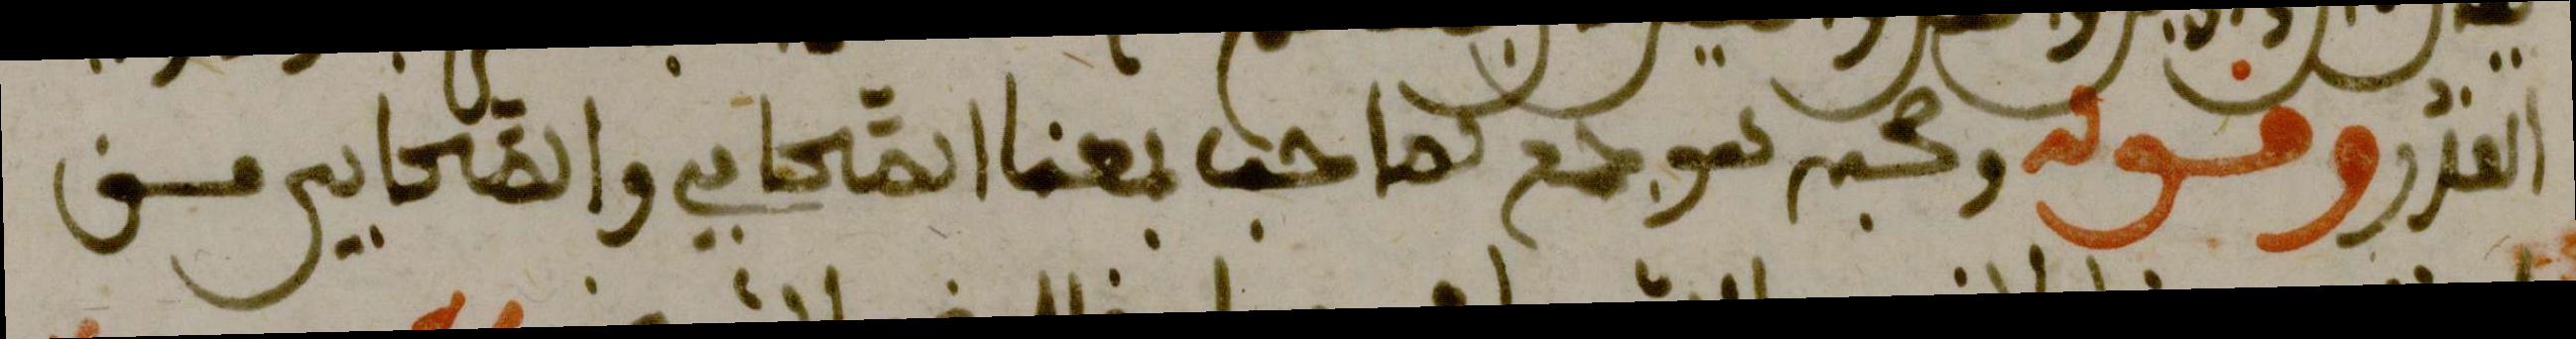القدر وقوله ومحبه هو جمع لصاحب بمعنا الصّحابي والصّحابي من
